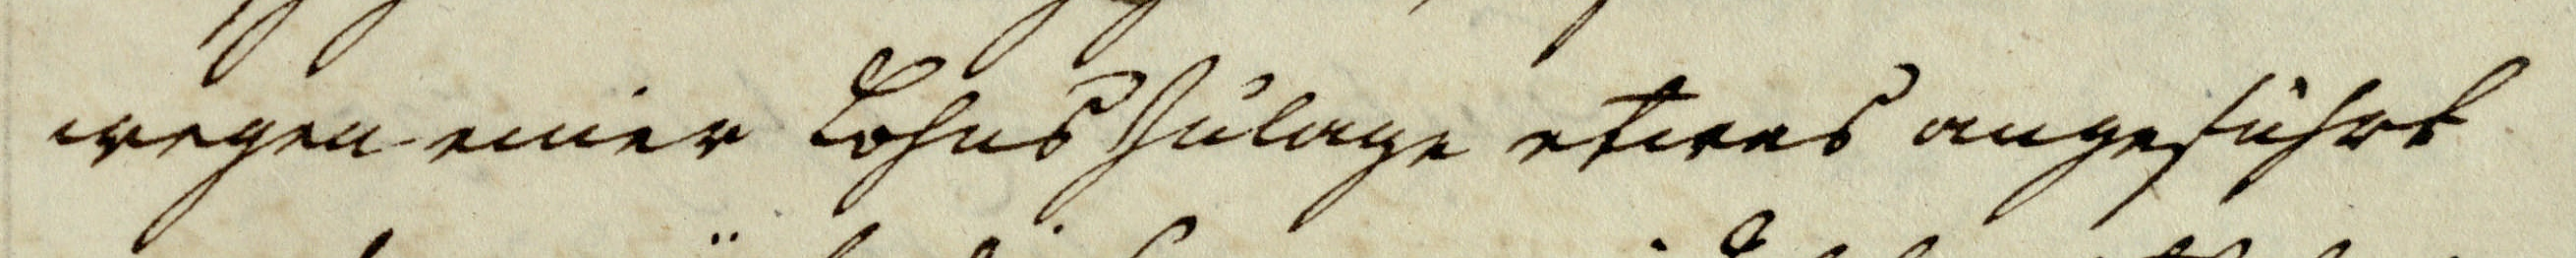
wegen einer Lohns Zulage etwas angeführt
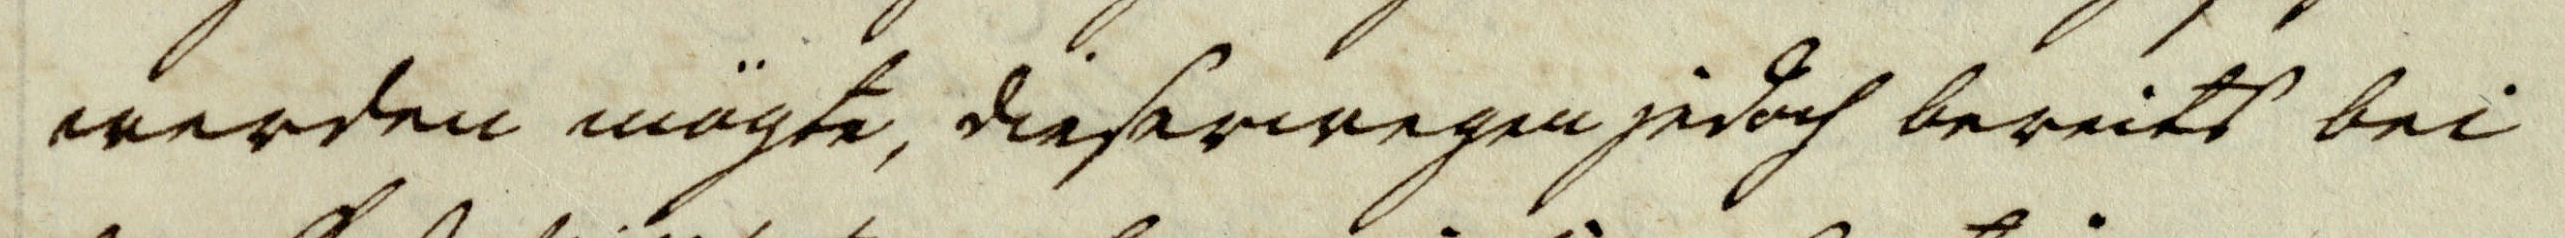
werden möchte, dieserwegen jedoch bereits bei
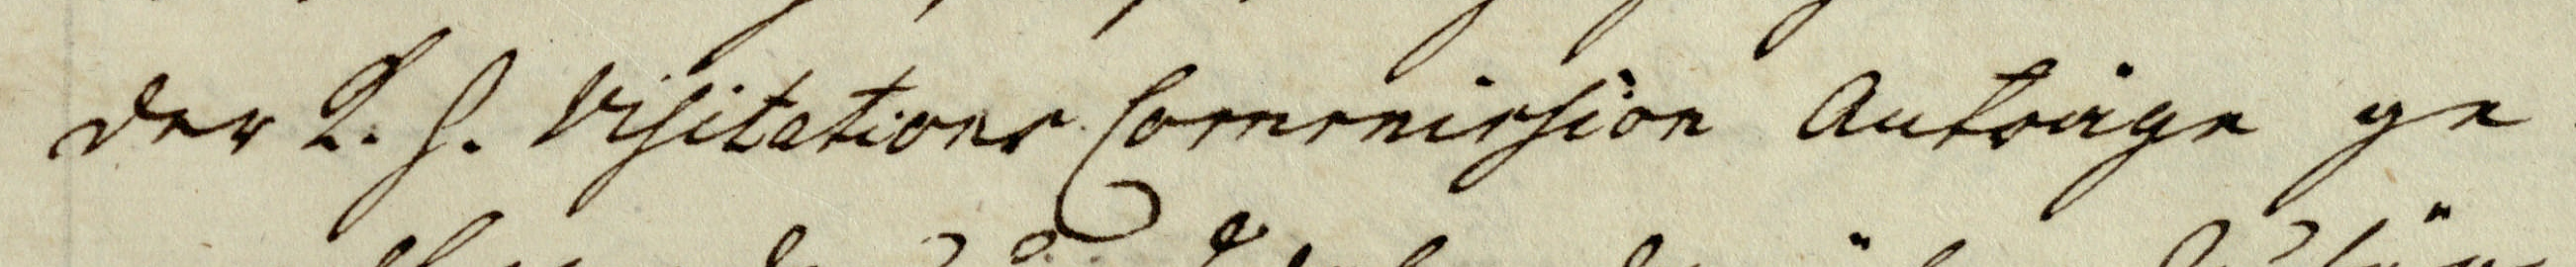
der K. H. Visitations Commission Anträge ge¬
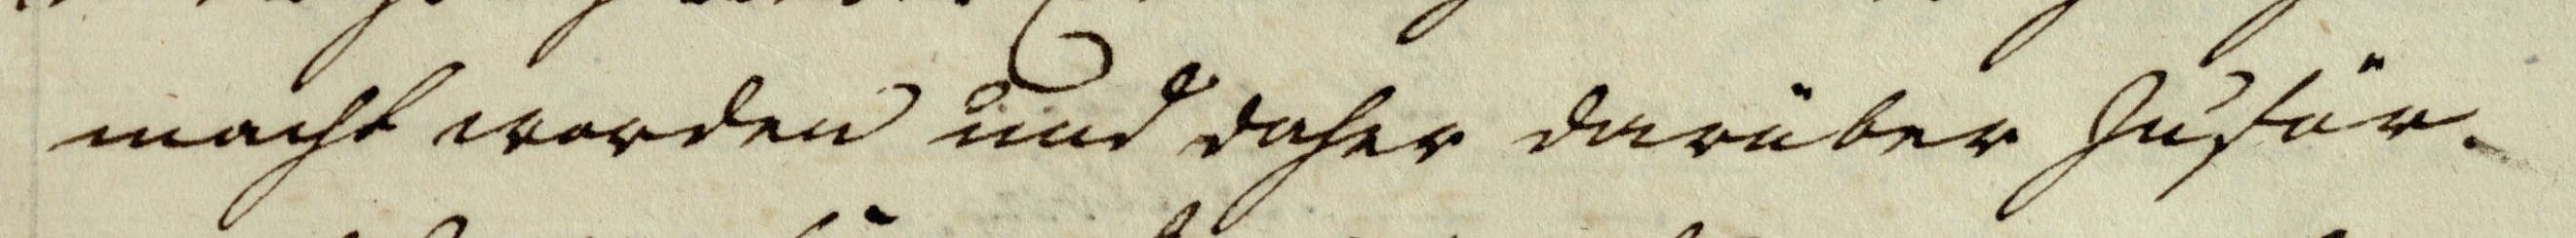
macht worden und daher darüber zuför¬
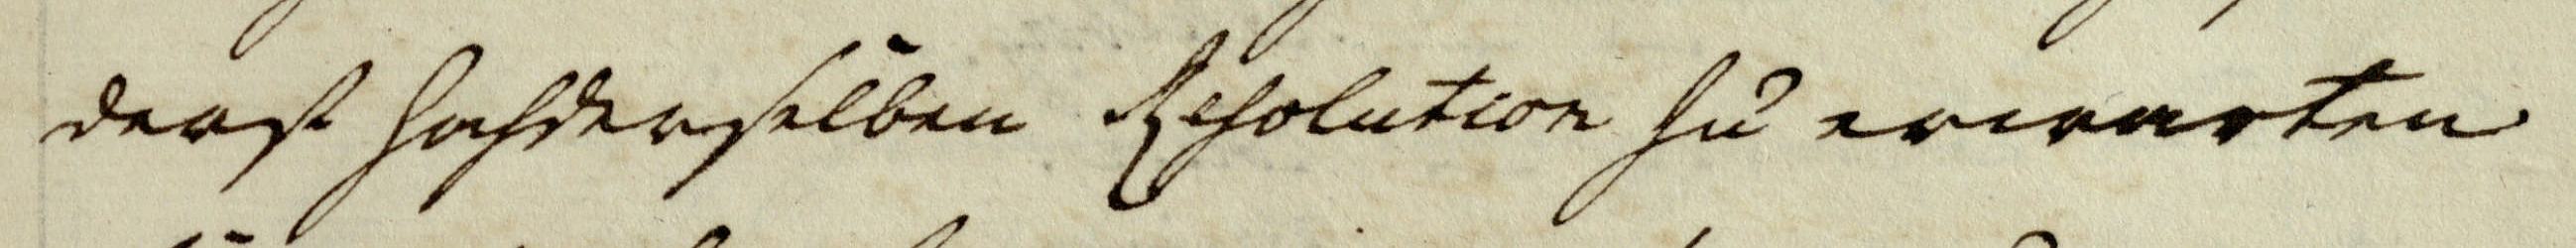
derst Hochderselben Resolution zu erwarten
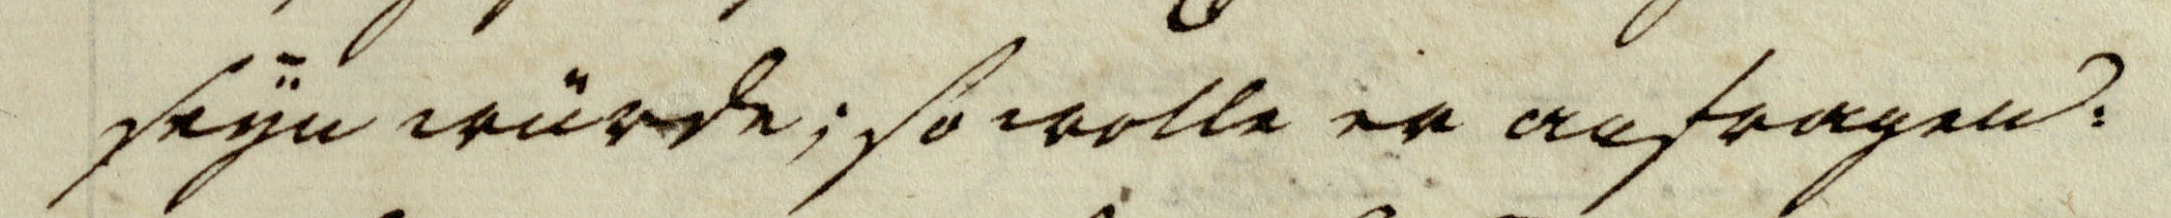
seÿn würde; so wolle er anfragen:
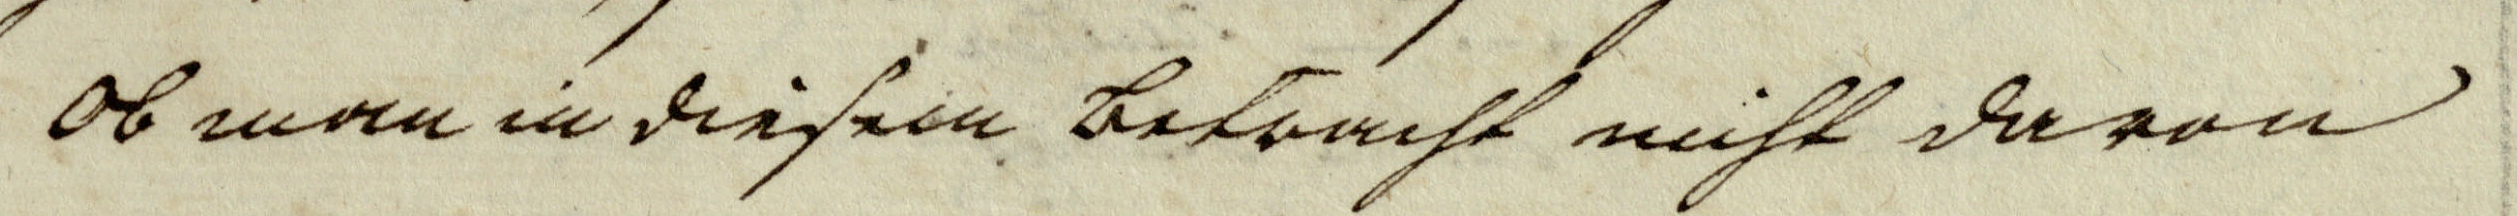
Ob man in diesem Betracht nicht davon
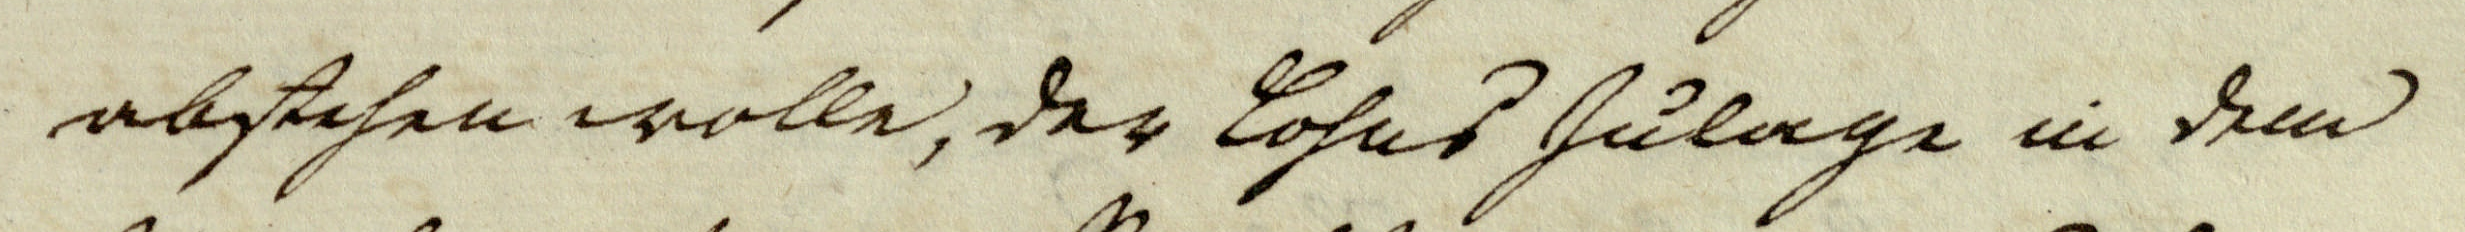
abstehen wolle, der Lohns Zulage in dem
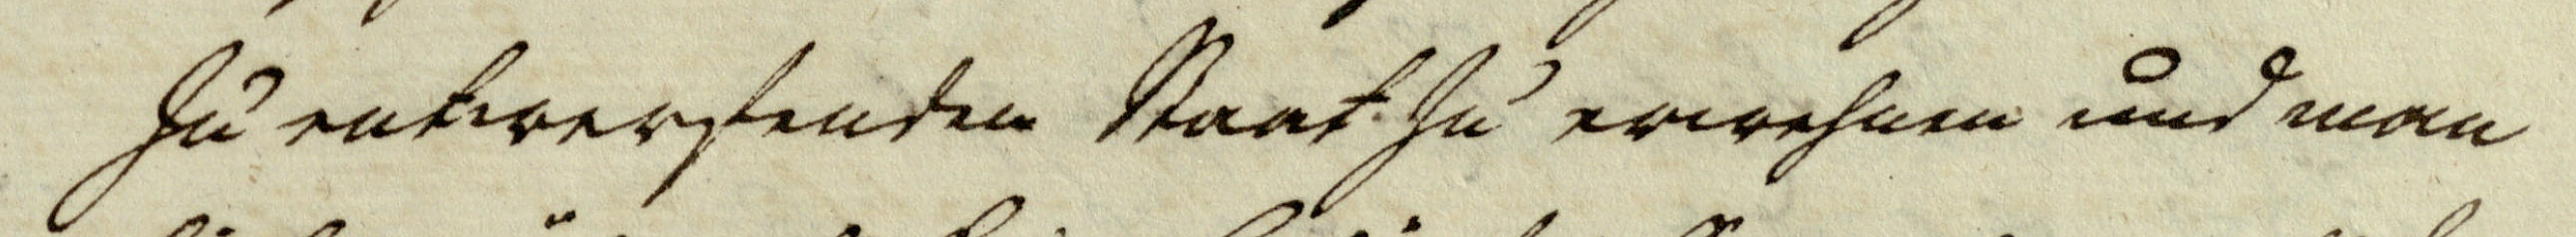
zu entwerfenden Staat zu errechnen und man
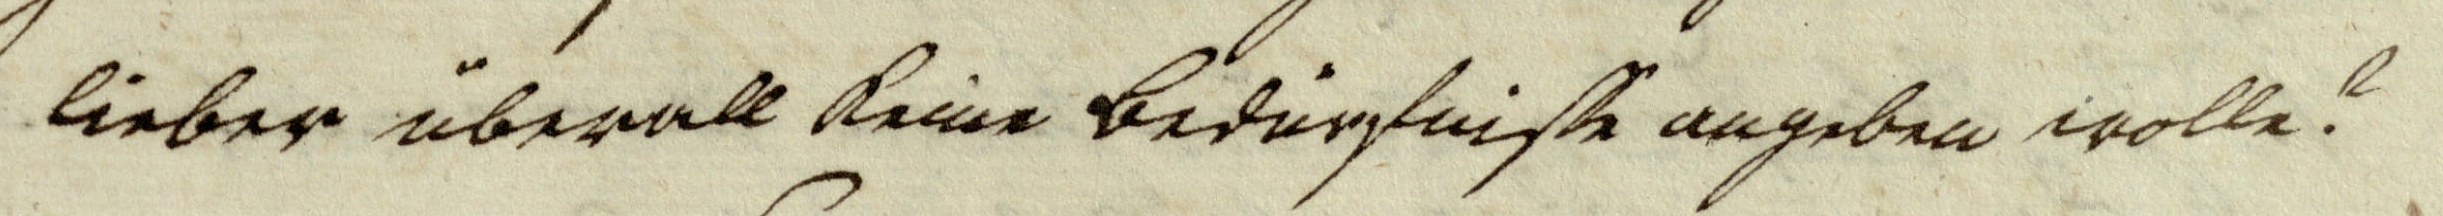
lieber überall keine Bedürfnisse angeben wolle?
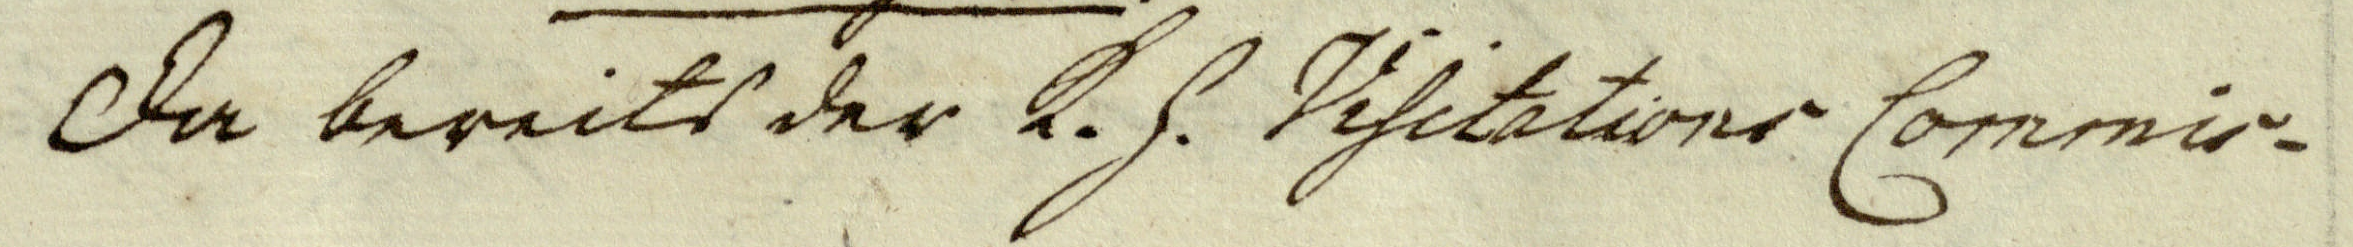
Da bereits der K. H. Visitations Commis¬
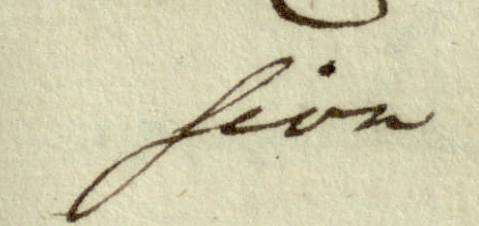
sion
